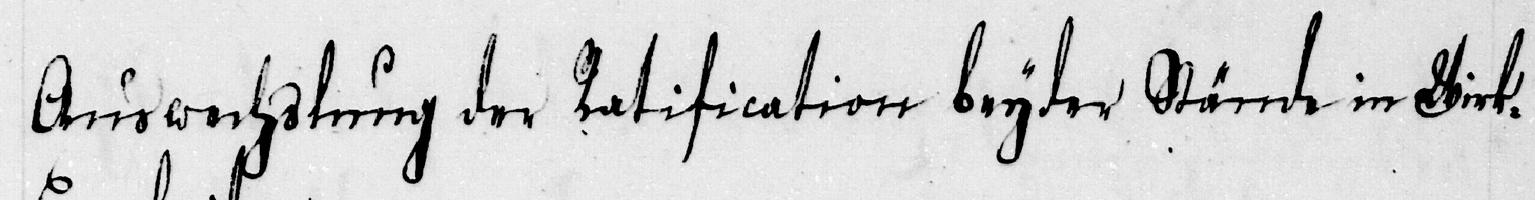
Auswechslung der Ratification beyder Stände in Wirk¬
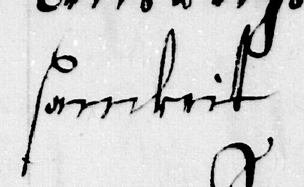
samkeit.
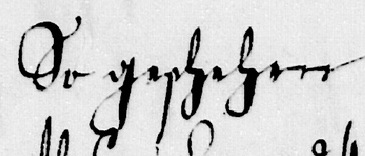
So geschehen
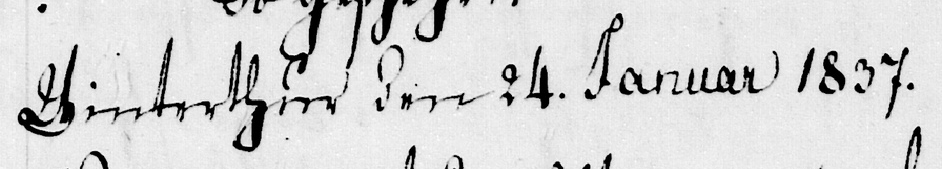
Winterthur den 24. Januar 1837.
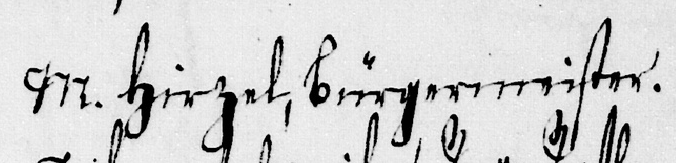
M. Hirzel, Bürgermeister.
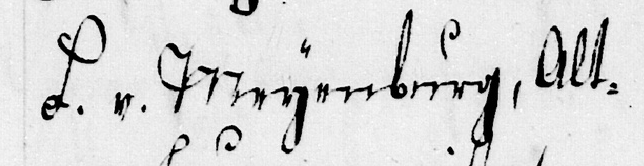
F. v. Meyenburg, Al¬
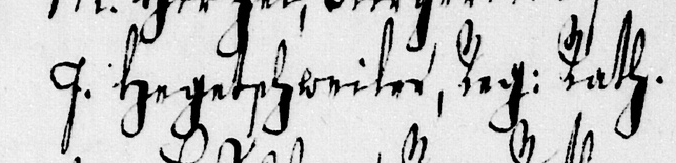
J. Hegetschweiler, Reg: Rath.
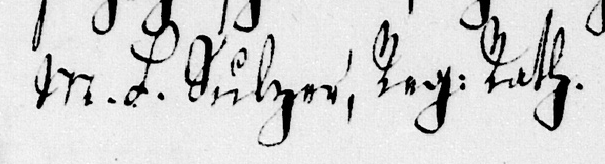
M. F. Sulzer, Reg: Rath.
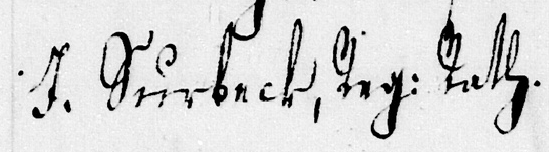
I. Surbeck, Reg: Rath.
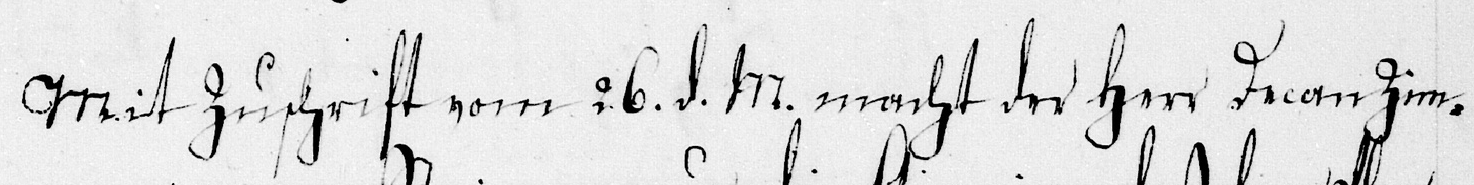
Mit Zuschrift vom 26. d. M. macht der Herr Decan Zim¬
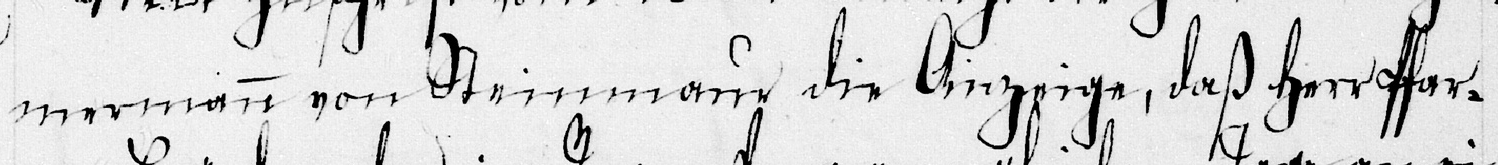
mermann von Steinmaur die Anzeige, daß Herr Pfar¬
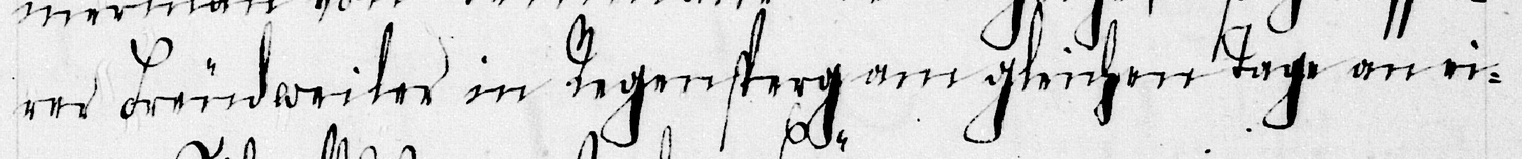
rer Freudweiler in Regensperg am gleichen Tage an ei¬
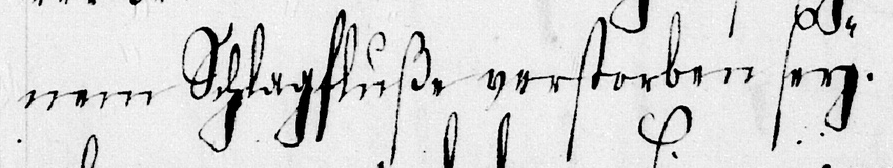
nem Schlagfluße verstorben sey.
